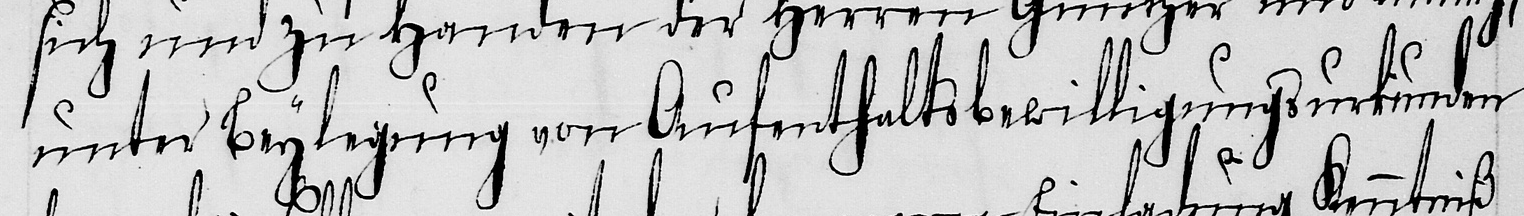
unter Beylegung von Aufenthaltsbewilligungsurkunden
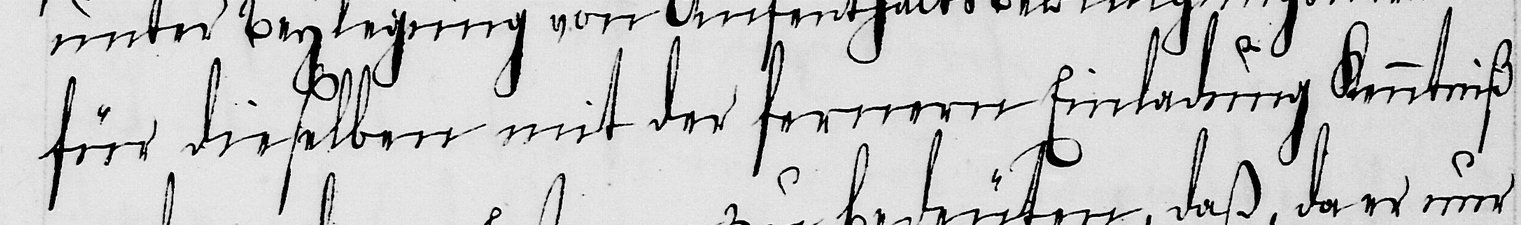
für dieselben mit der fernern Einladung Kenntniß
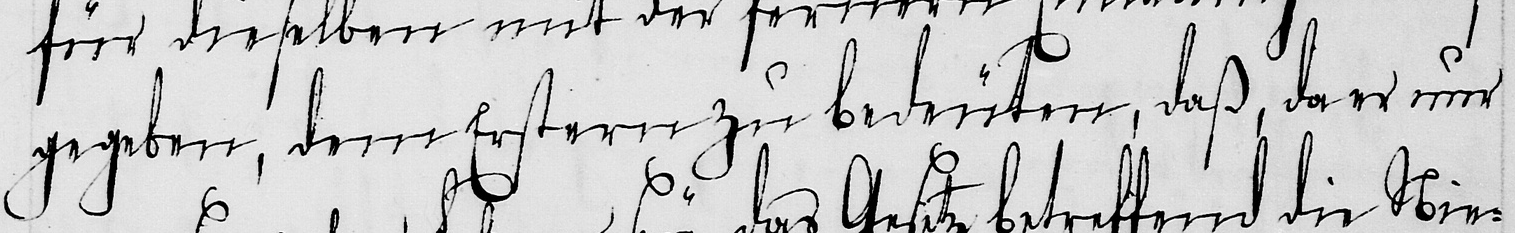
gegeben, dem Erstern zu bedeuten, daß, da er nur
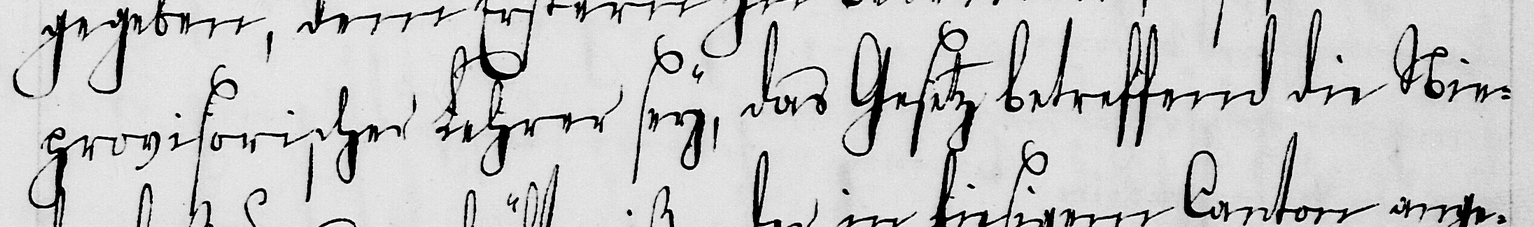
provisorischer Lehrer sey, das Gesetz betreffend die Nie¬
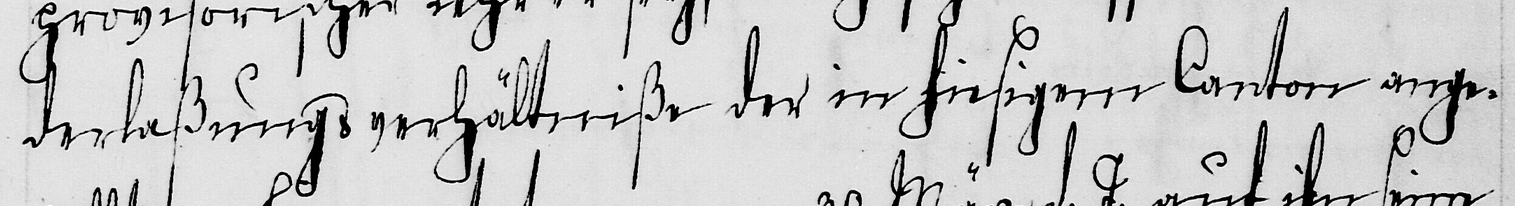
derlaßungsverhältniße der in hiesigem Canton ange¬
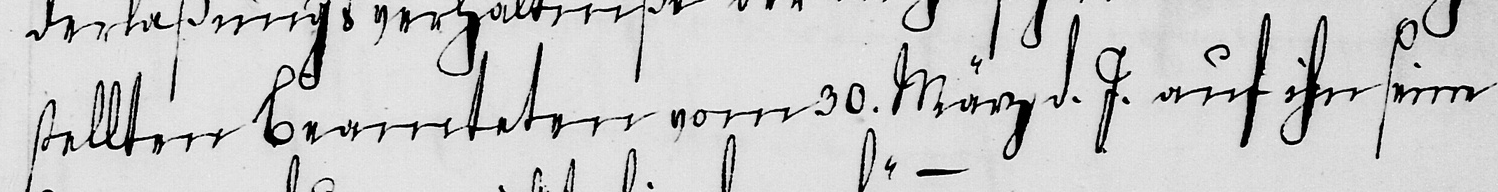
stellten Beamteten vom 30. März d. J. auf ihn seine
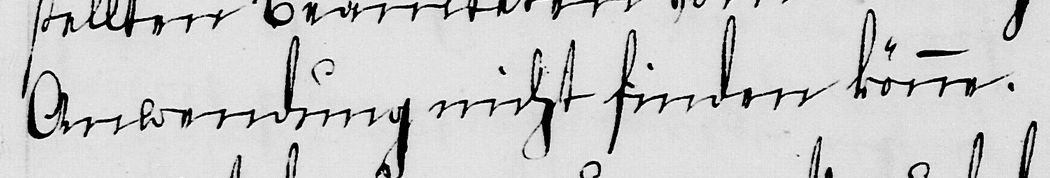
Anwendung nicht finden könne.
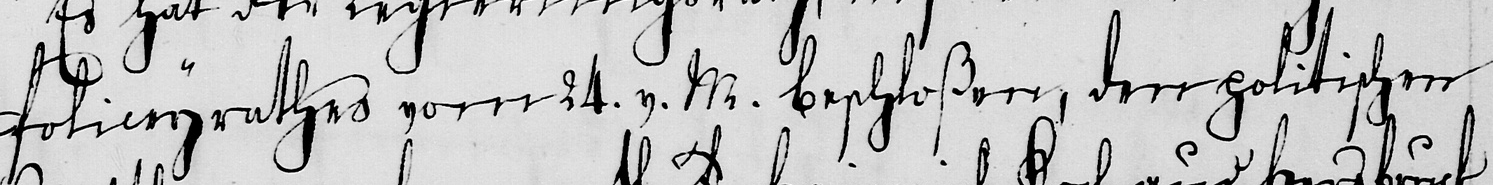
Policeyrathes vom 24. v. M. beschloßen, den politischen
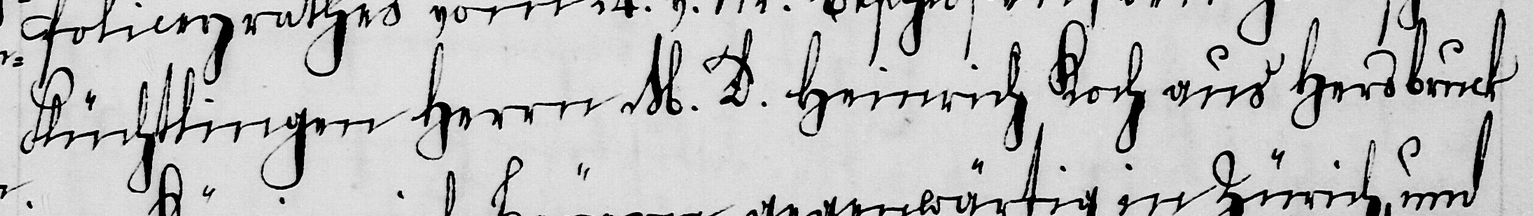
Flüchtlingen Herrn M. D. Heinrich Koch aus Hersbruck
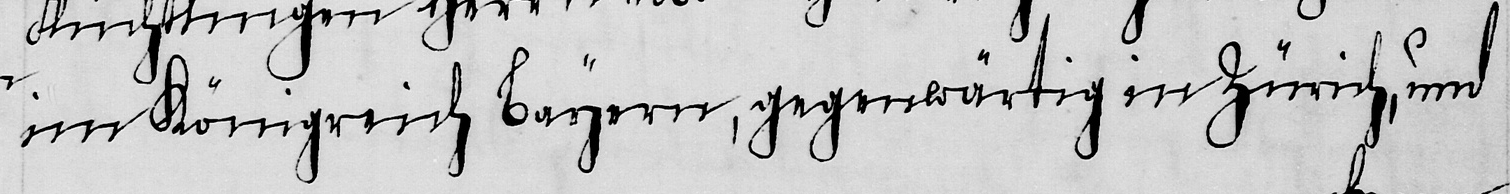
im Königreich Bayern, gegenwärtig in Zürich, und
